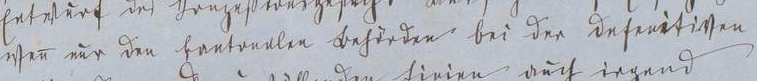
wenn nur den kantonalen Behörden bei der definitiven
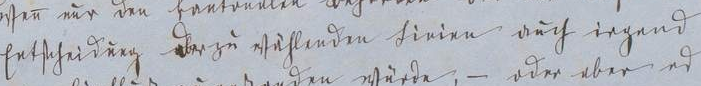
Entscheidung der zu wählenden Linien auch irgend
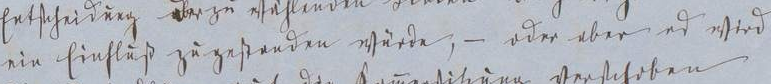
ein Einfluß zugestanden würde,– oder aber es wird
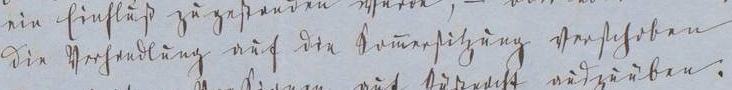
die Verhandlung auf die Sommersitzung verschoben
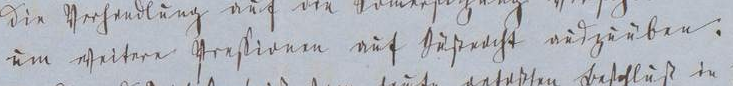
um weitere Pressionen auf Küßnacht auszuüben.
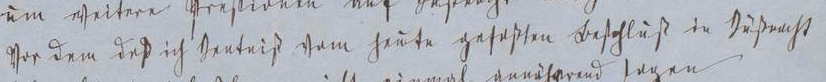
Vor dem daß ich Kentniß vom heute gefaßten Beschluß in Küßnacht
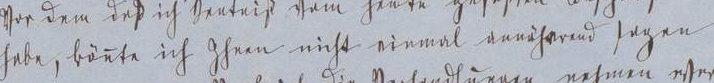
habe, könnte ich Ihnen nicht einmal annähernd sagen
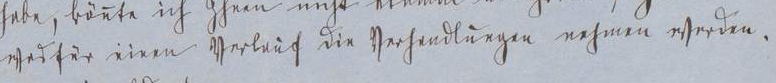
was für einen Verlauf die Verhandlungen nehmen werden.
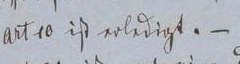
art 10 ist erledigt. –
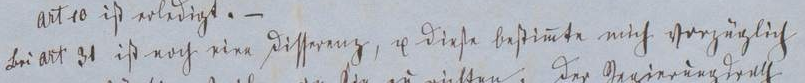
Bei art 31 ist noch eine Differenz, & diese bestimmte mich vorzüglich
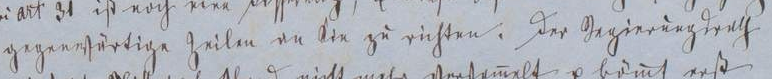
gegenwärtige Zeilen an Sie zu richten. Der Regierungsrath
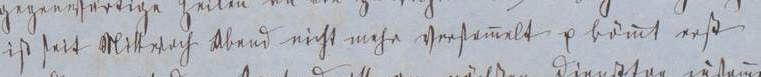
ist seit Mittwoch Abend nicht mehr versammelt & kömmt erst
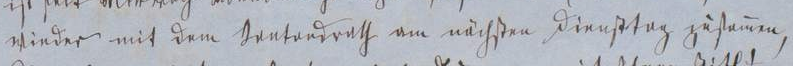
wieder mit dem Kantonsrath am nächsten Dienstag zusammen,
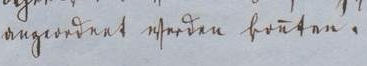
angeordnet werden konnten.
